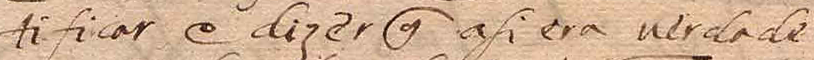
tificar e dizer q̄ asi era uerdade
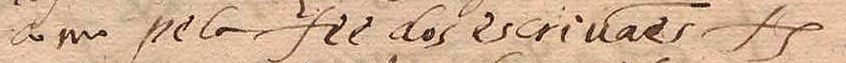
como pela fee dos escriuães fꝭ
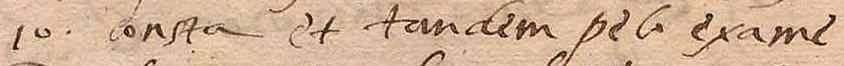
10. consta et tandem pelo exame
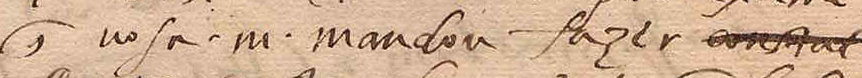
q̄ uosa .m. mandou fazer constat
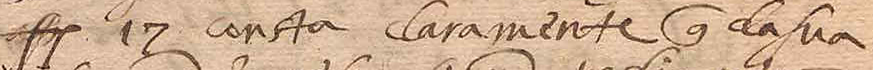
fꝭ 17 consta claramente q̄ da sua
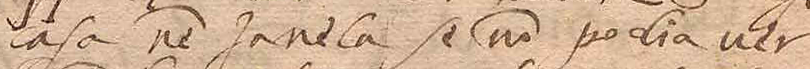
casa nē Janela se n̄o podia uer
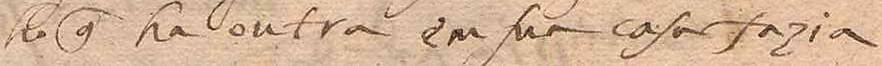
ho q̄ ha outra em sua casa fazia
